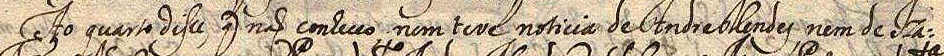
Ao quarto disse, q̄ naõ conheceo nem teve noticia de Andre Mendes, nem de Iza
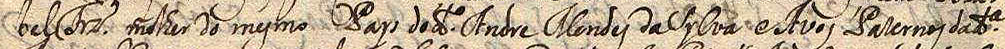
bel Frz̄. molher do mesmo Pays do d̄.o Andre Mendes da Sylva, e Avos Paternos da d̄.a
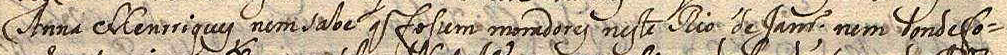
Anna Henrriques, nem sabe q̄ fossem moradores neste Rio de Janro; nem donde fo
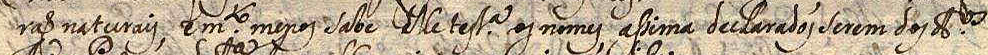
raõ naturais, e m.to menos sabe elle test.a os nomes assima declarados serem dos d̄.os
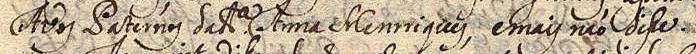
Avos Paternos da d̄a Anna Henrriques, e mais naõ disse.
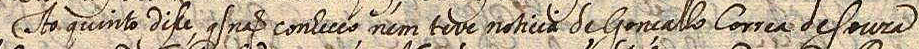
Ao quinto disse, q̄ naõ conheceo, nem teve noticia de Gonçallo Correa de Souza
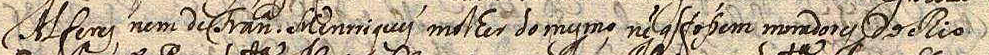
Alferes, nem de Fran.ca Henrriques molher do mesmo, nē q̄ fossem moradores do Rio
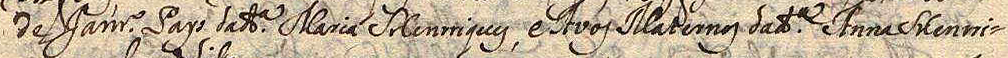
de Janr.o Pays da d̄.a Maria Henrriques, e Avos Maternos da d̄.a Anna Henrri
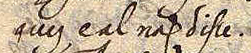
ques, e al naõ disse.
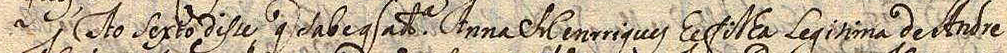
Ao sexto disse q̄ sabe q̄ a d̄.a Anna Henrriques he filha Legitima de Andre
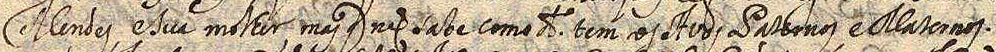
Mendes, e sua molher mas q̄ naõ sabe como d̄.o tem os Avos Paternos, e Maternos.
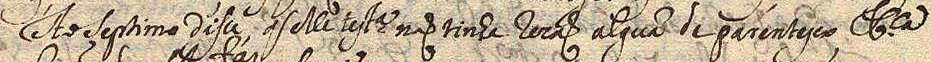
Ao Septimo disse, q̄ elle test.a naõ tinha Rezaõ alguā de parentesco, &.ca
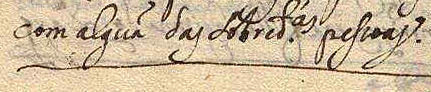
com alguā das sobred.as pessoas.
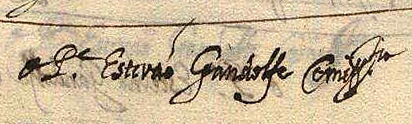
o P.e Estevaõ Gandolfe Comissrio
